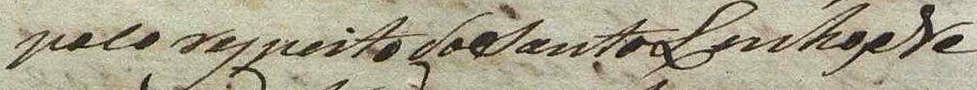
poco respeito do Santo Lenho, e Ve
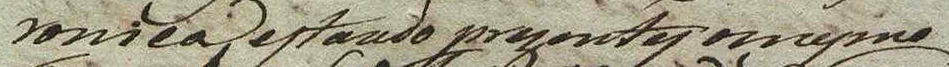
ronica, estando prezentes o mesmo
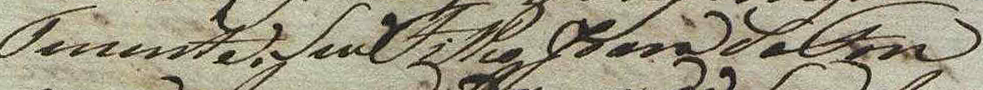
Tenente, seu Filho Joam da Fon
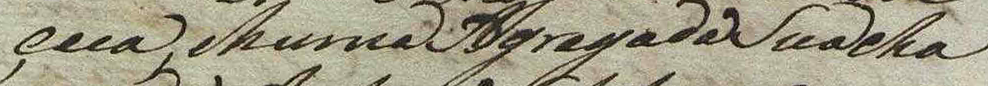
çeca, e huma Agragada Sua cha
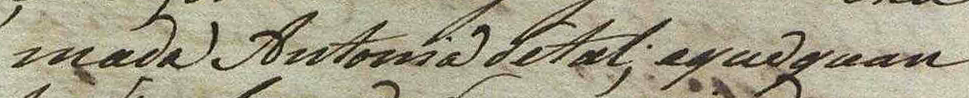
mada Antonia de tal; e que quan
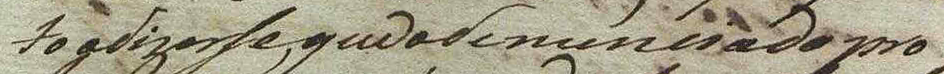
to a dizerse, que o denunciado pro
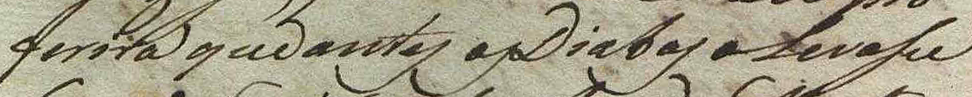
ferira que antes os Diabos o Levasse
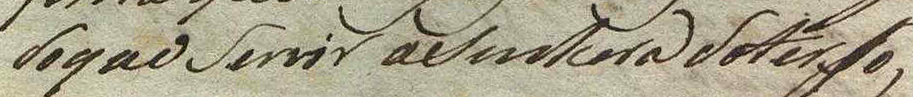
do que servir a Senhora do terso,
